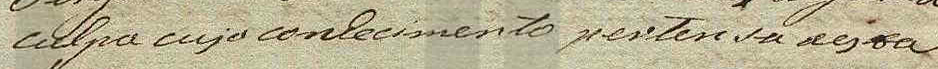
culpa cujo conhecimento pertensa a esta
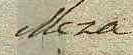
Meza
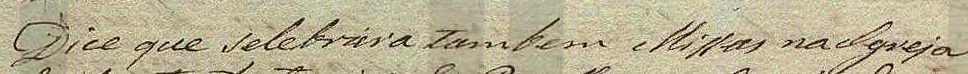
Dice que selebrara tambem Missas na Igreja
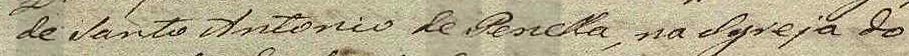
de Santo Antonio de Penella, na Igreja do
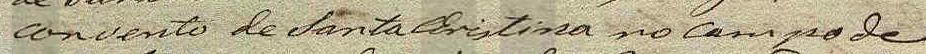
convento de Santa christina no campo de
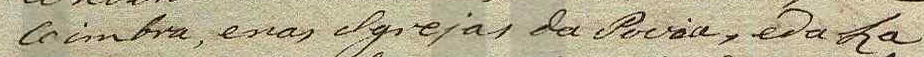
Coimbra, e nas Igrejas da Povia, e da La
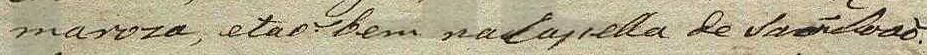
maroza, e taõbem na Capella de saõ Ioaõ
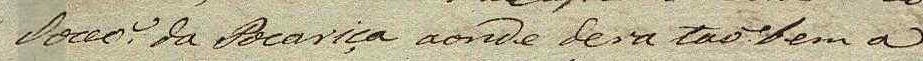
Ioaõ da Pocariça aonde dera taõbem a
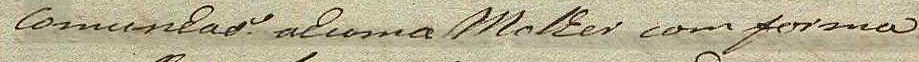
comunhaõ a huma Molher com forma
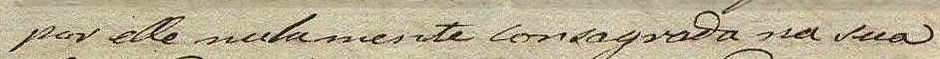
por elle nulamente consagrada na sua
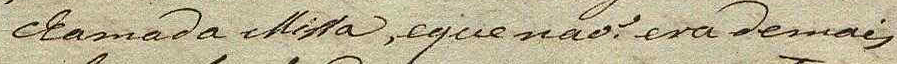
chamada Missa, e que naõ era de mais
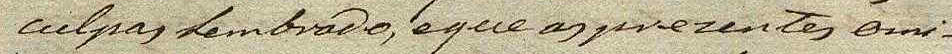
culpas Lembrado, e que as prezentes omi
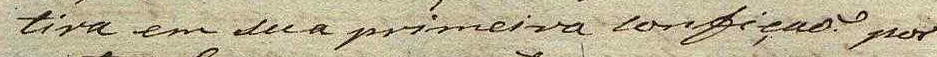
tira em sua primeira confiçaõ por
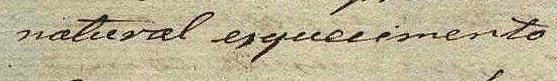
natural esquecimento
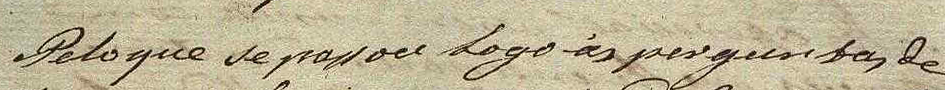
Pelo que se passou Logo às perguntas de
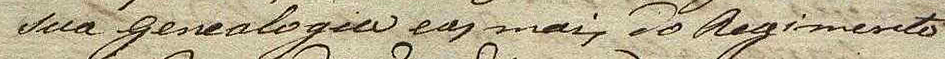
sua genealogia, e as mais do Regimento
